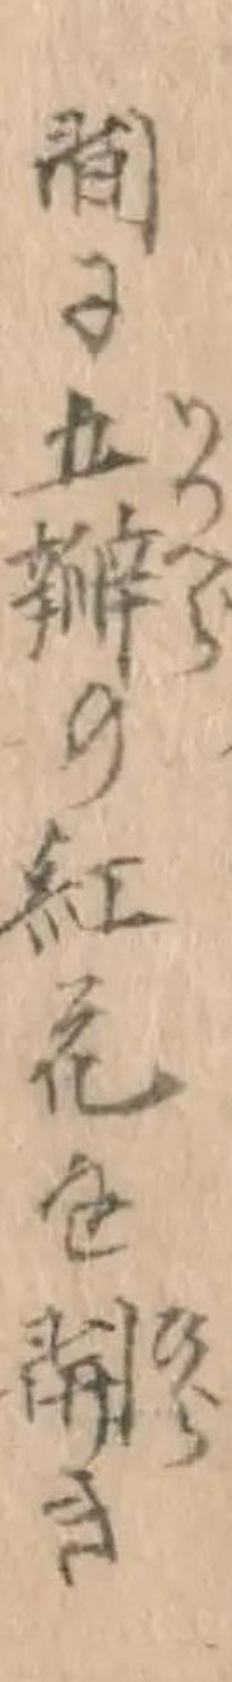間に五弁の紅花を開き
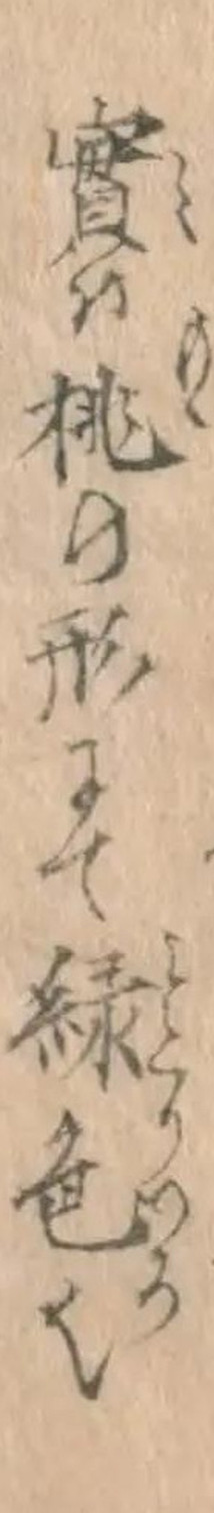実は桃の形にて緑色也
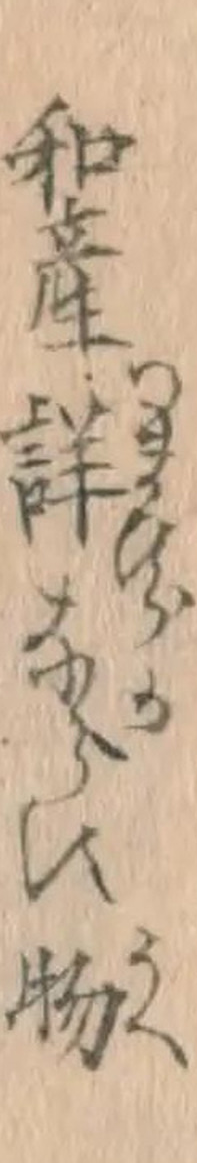和産詳ならす物
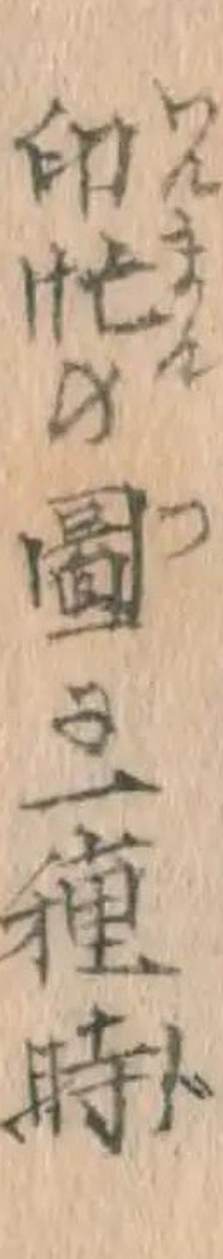印忙の図に一種時
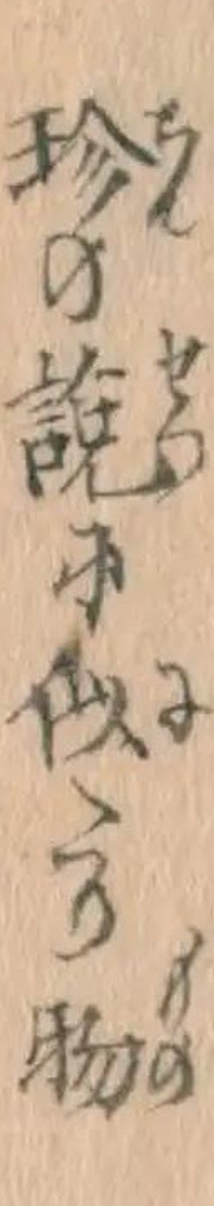珍の説に似たり物
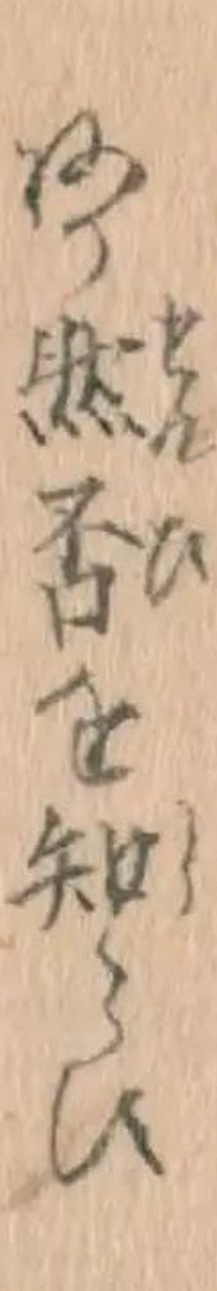あり然否を知らす
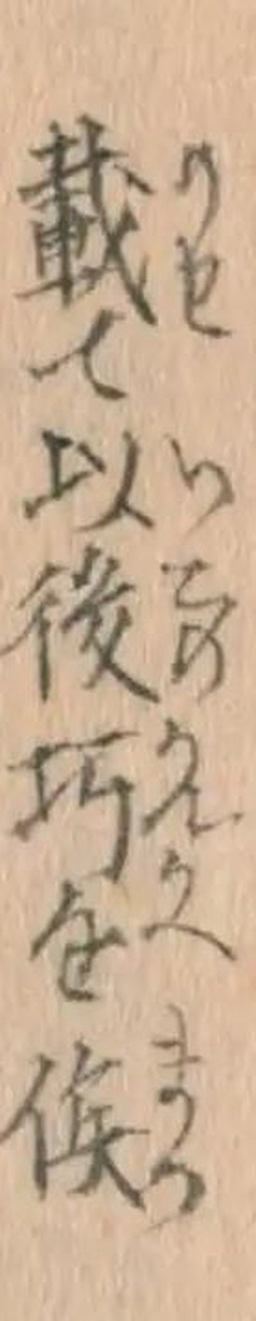載て以後巧を俟
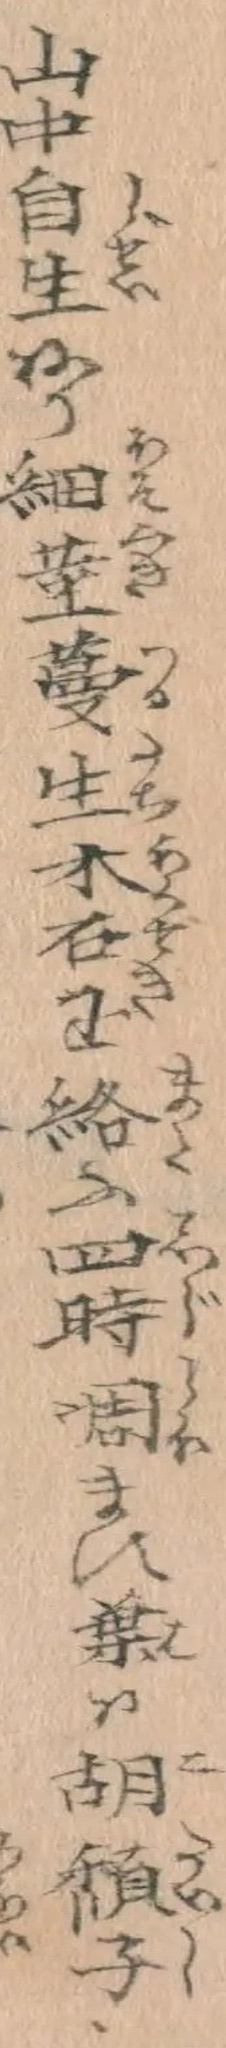山中自生あり細茎蔓生木石を絡ふ四時凋ます葉は胡頽子
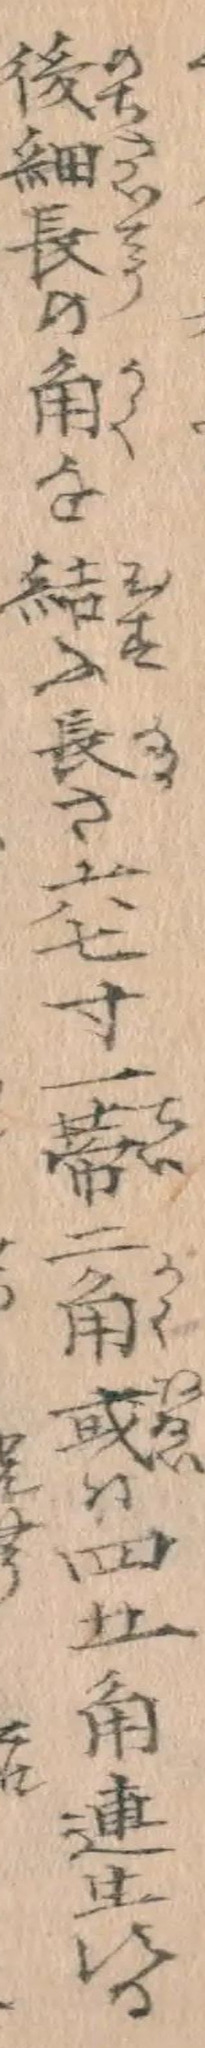後細長の角を結ふ長さ六七寸一蒂二角或は四五角連生する
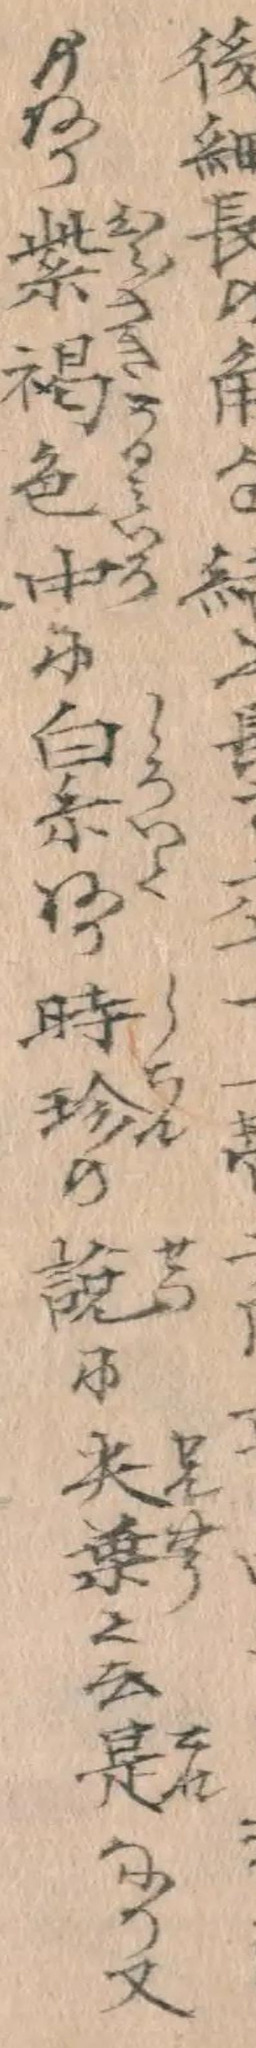もあり紫褐色中に白糸あり時珍の説に尖葉と云是なり又
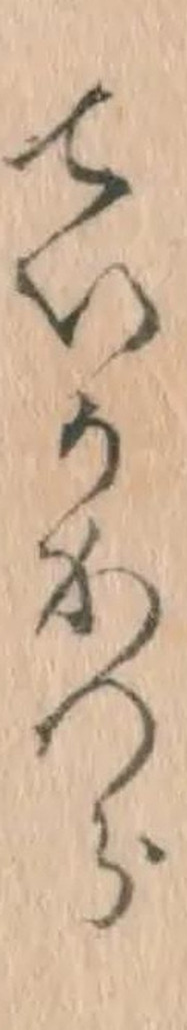ていかかつら
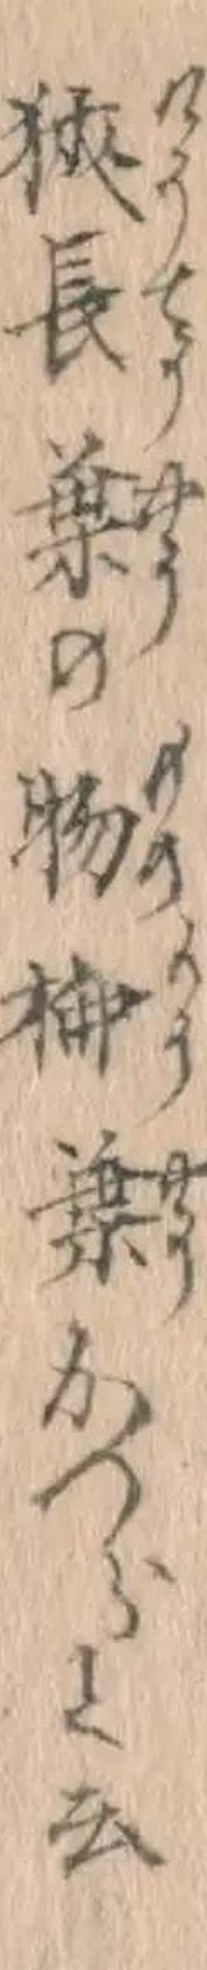狭長葉の物柳葉かつらと云

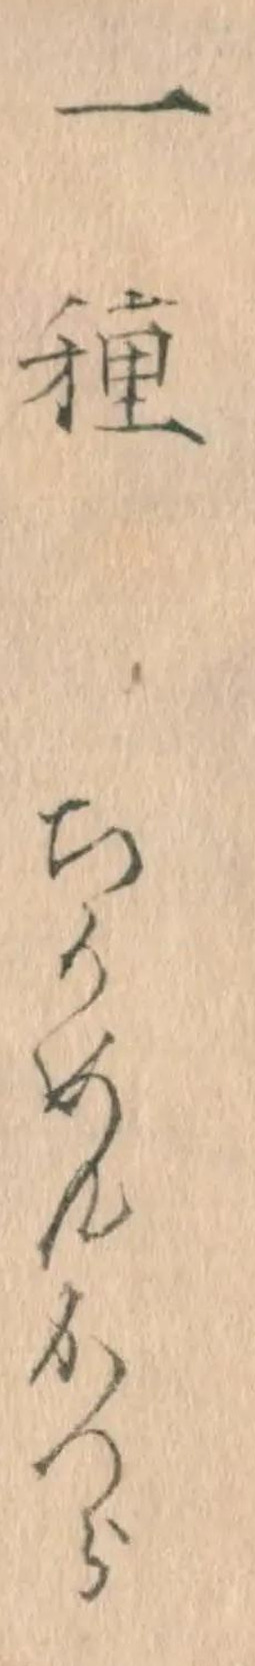一種ちりめんかつら
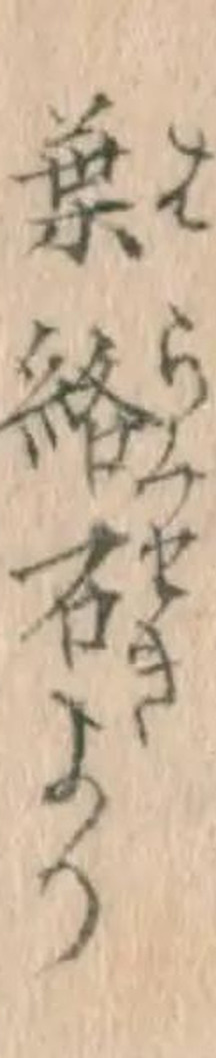葉絡石より
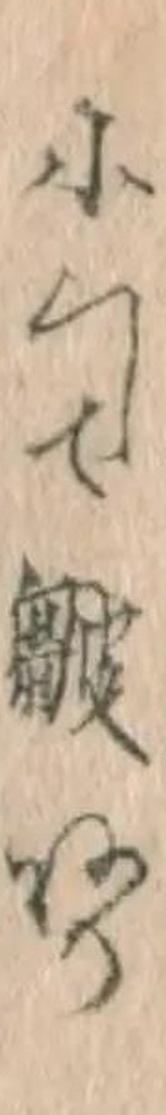小くして皺あり
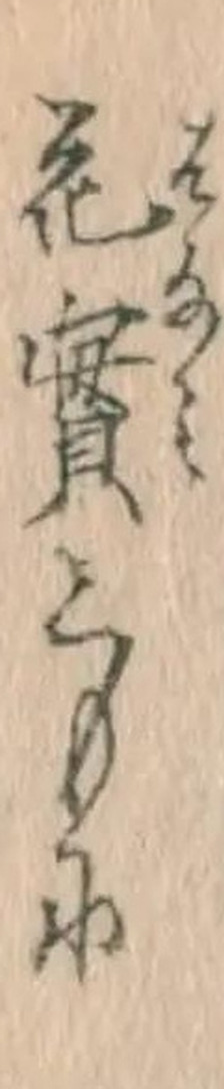花実ともに
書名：本草図譜. 巻31-33
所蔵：国立国会図書館 National Diet Library, JAPAN
